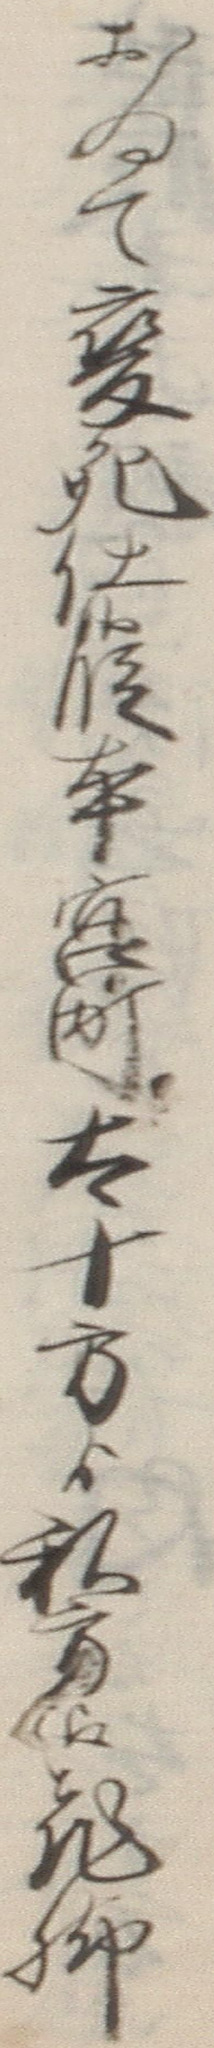おゐて変死仕候段本宮町太十方ゟ私方え飛脚
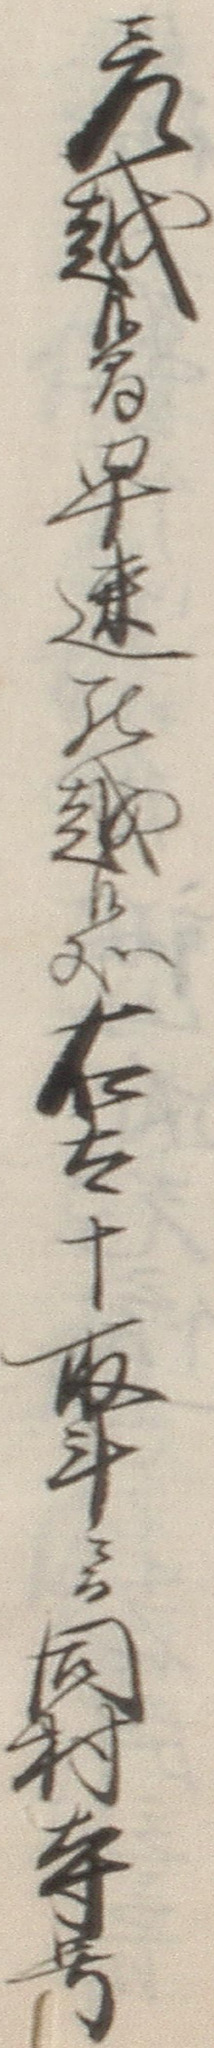差越候間早速罷越候処右太十取斗ニ而同村寺号
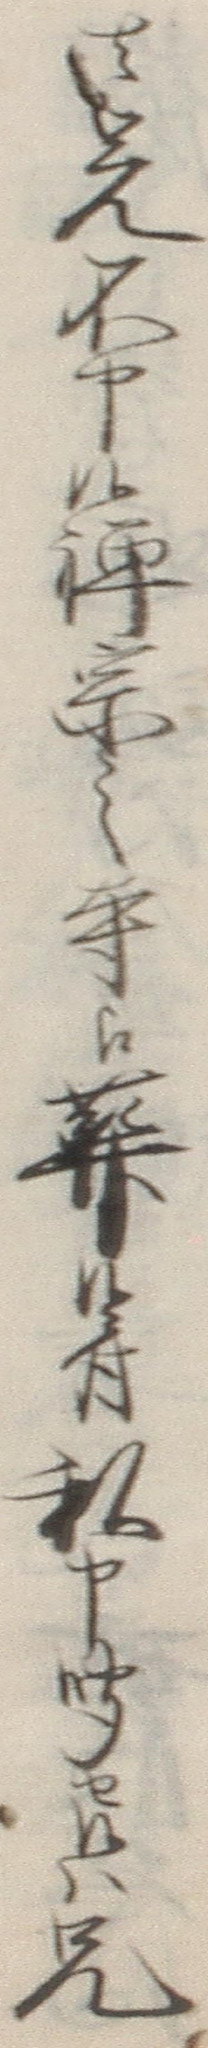は覚不申候禅宗之寺え葬候ニ付私申聞セ候ハ兄
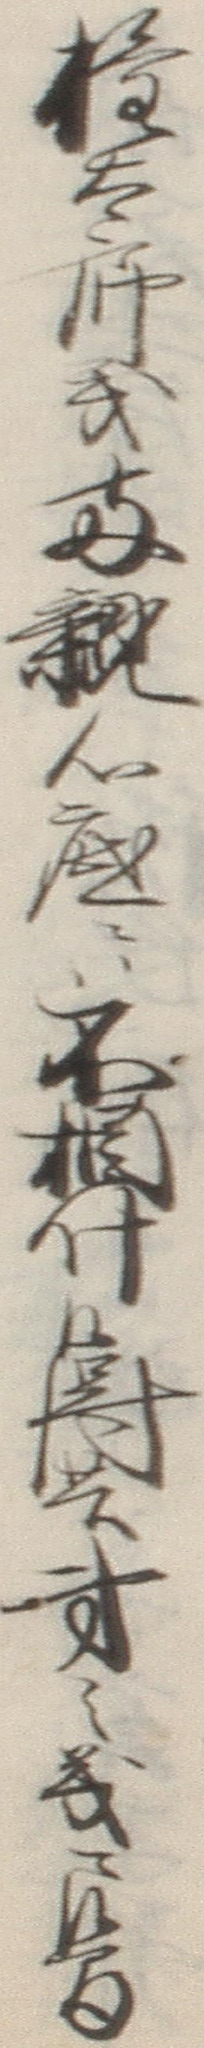権太郎義両親心底ニ不相叶候得共弟の義ニ候間
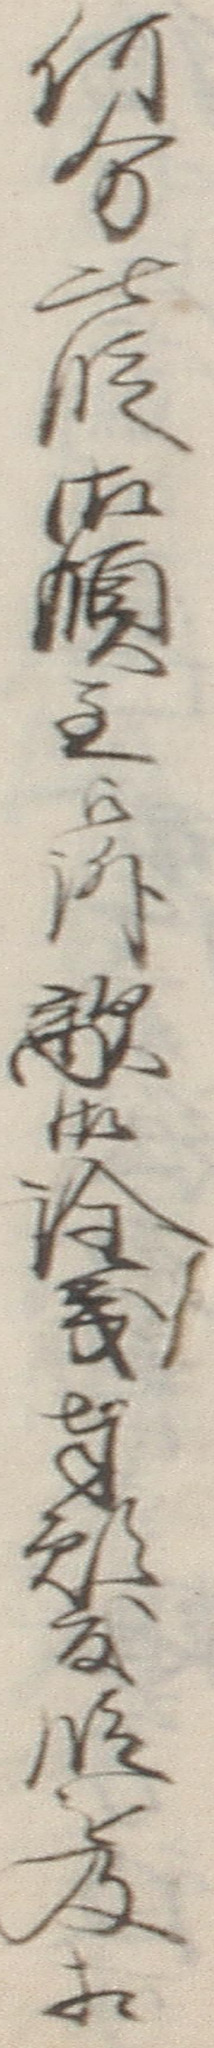何分此段御領主え訴敵御詮議奉願度段を及相
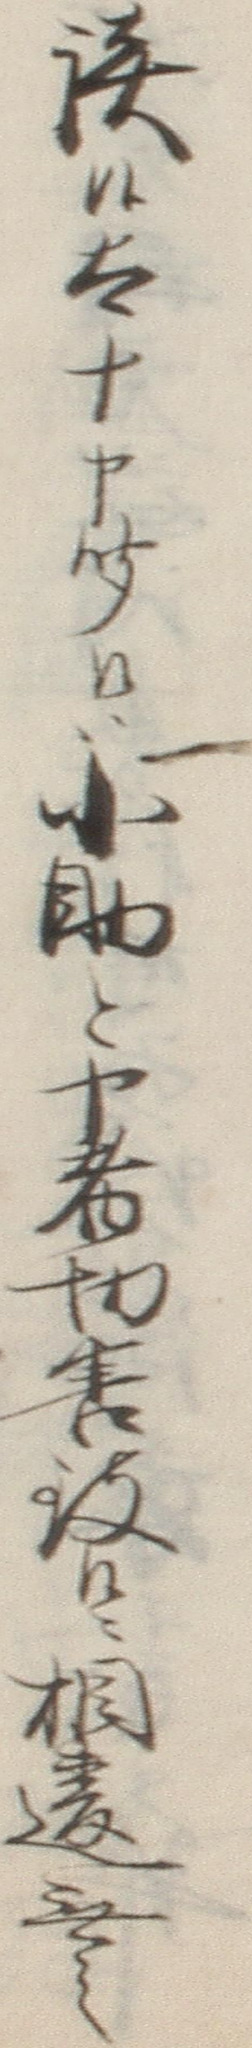談候太十申聞候ハ小助と申者切害致候ニ相違無之
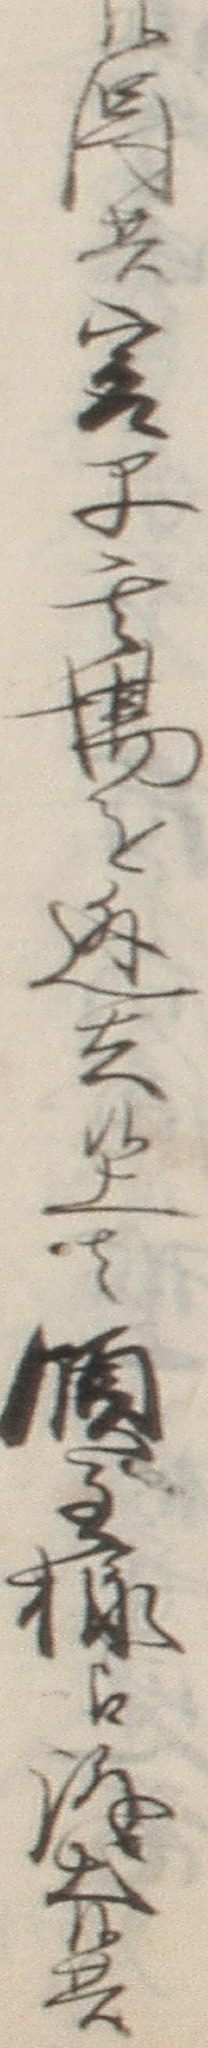候得共最早其場を逃去候上は領主様え訴出候共

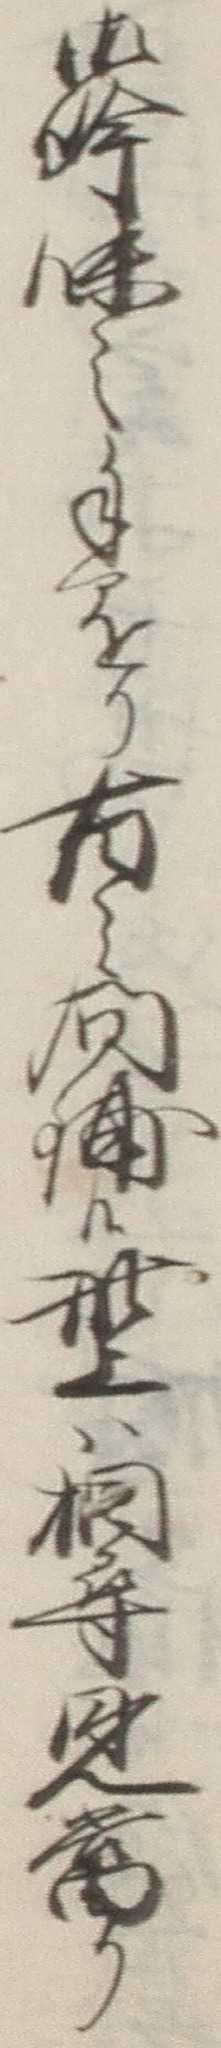御吟味の手懸り有之間鋪候此上ハ相尋見当り
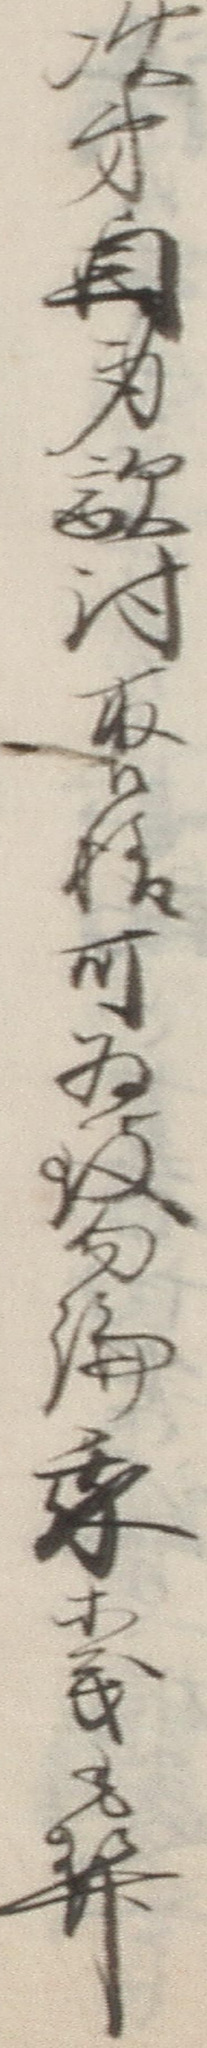次第自身敵討取候様可為致勿論我等義も契
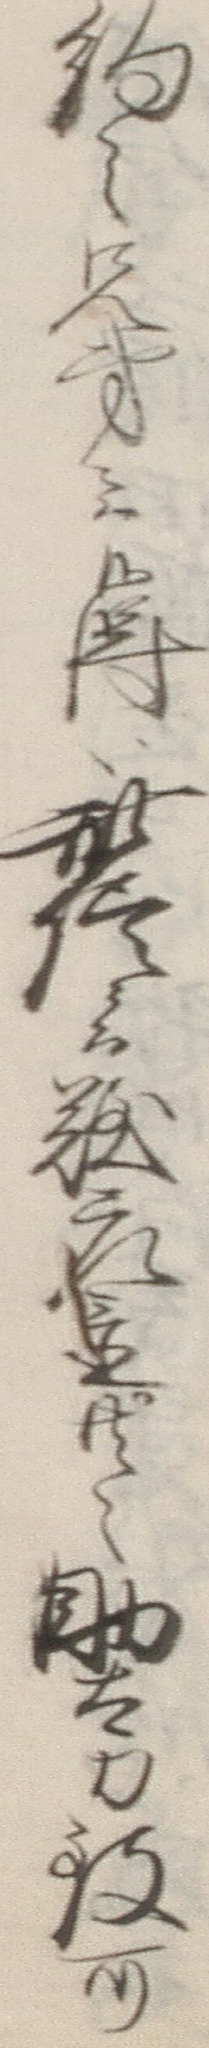約の兄弟ニハ候得ハ此侭ニ而難差置共々助太刀致可
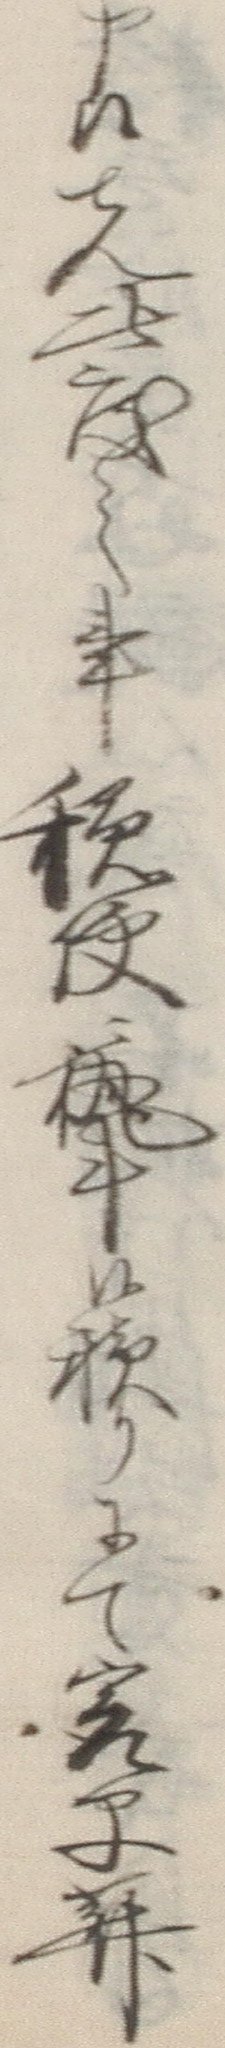申候先此度の事穏便ニ執斗候積りにて最早葬
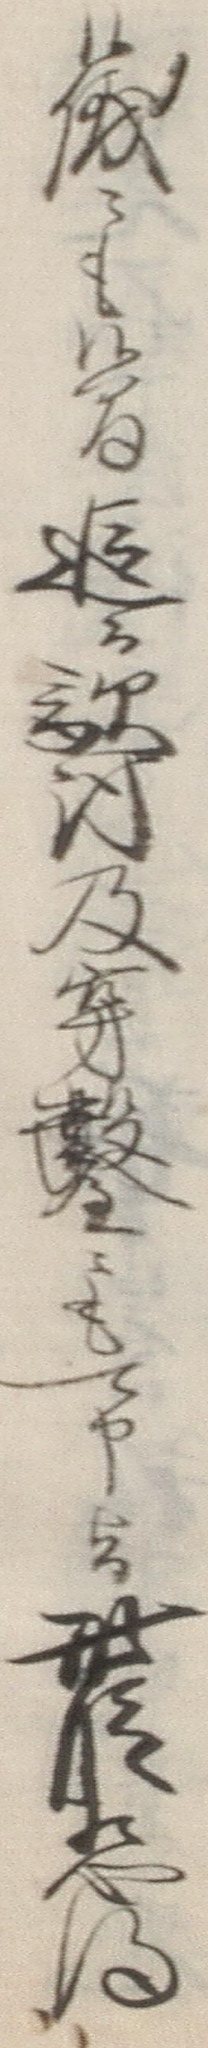候儀ニも候間追而敵討及穿鑿にも可申旨此段相心得
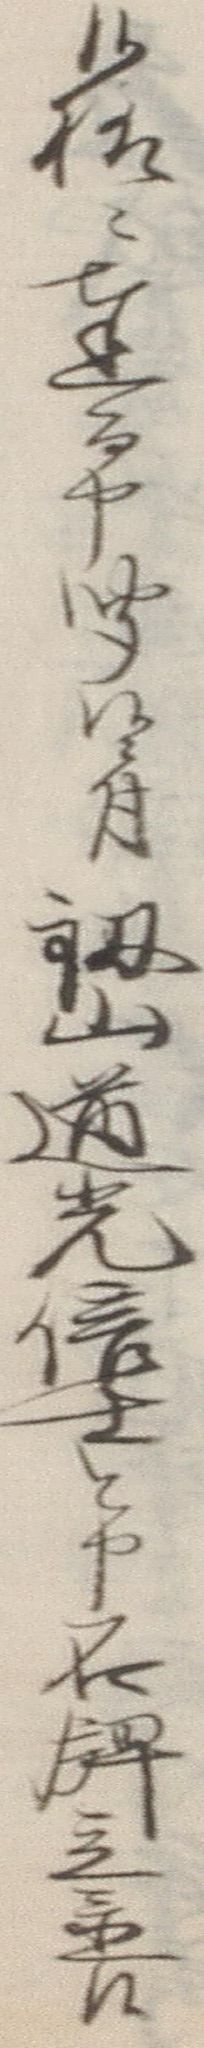且様ニ達而申聞候ニ付剣山道光信士と申石碑立置候
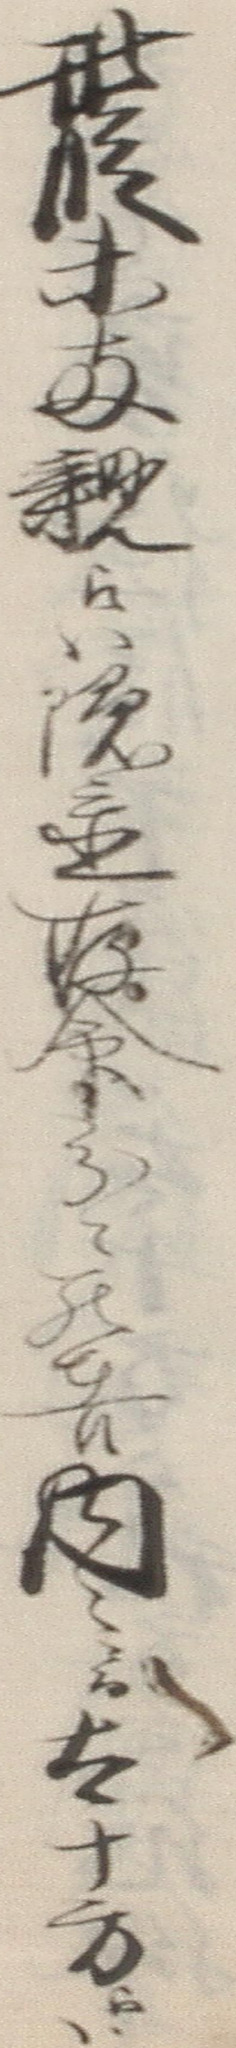此段未両親えハ隠置存命分ニ罷在候内々ニ而太十方えハ
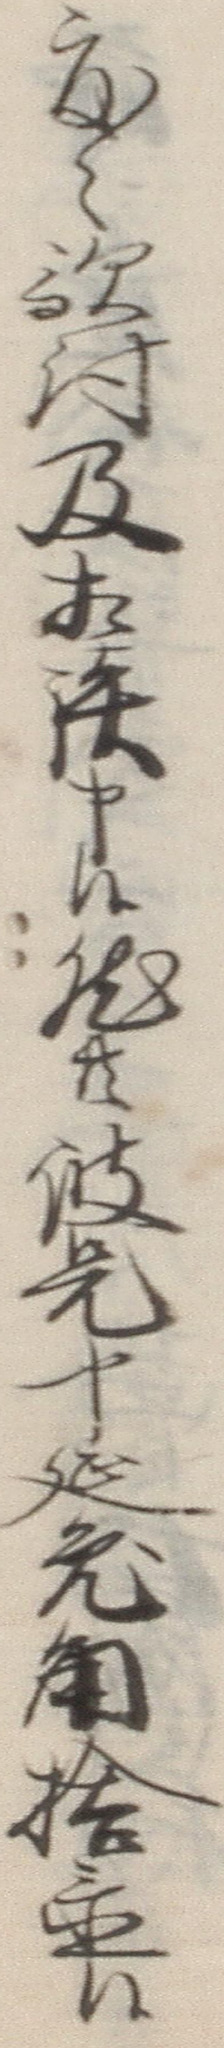度々歎付及相談申候然共彼是申延兎角捨置候
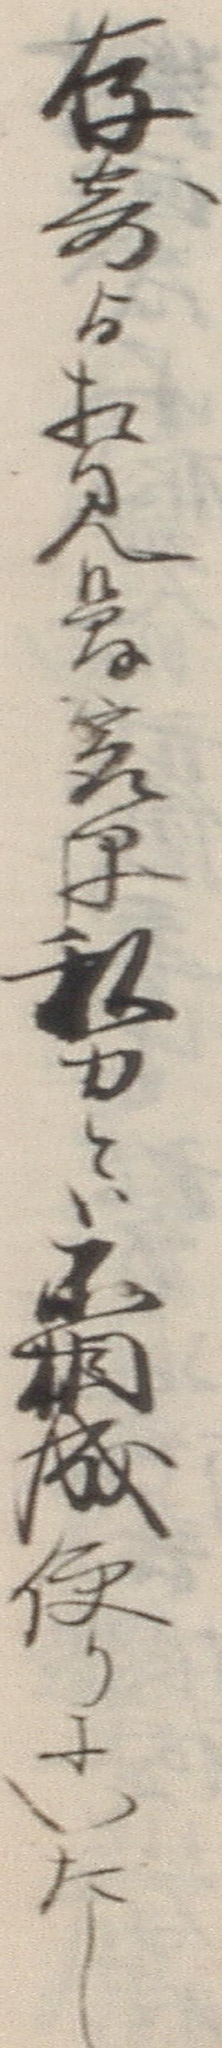存寄と相見候間最早私力とハ不相成便りにいたし
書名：[諸国災害記録]
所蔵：東京大学地震研究所図書室 Earthquake Research Institute Library, The University of Tokyo, JAPAN
